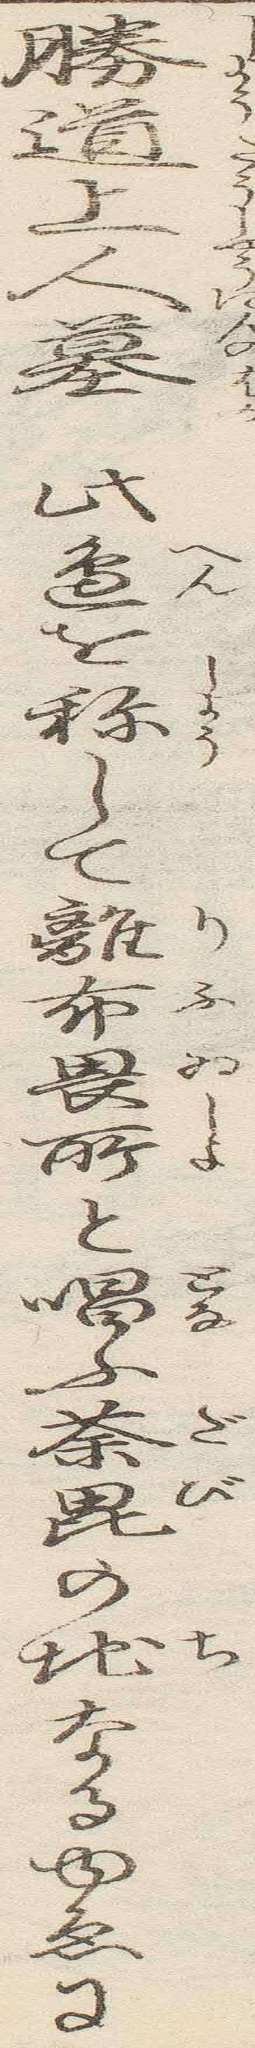勝道上人墓此邊を称して離布畏所と唱ふ荼毘の地なるゆゑに
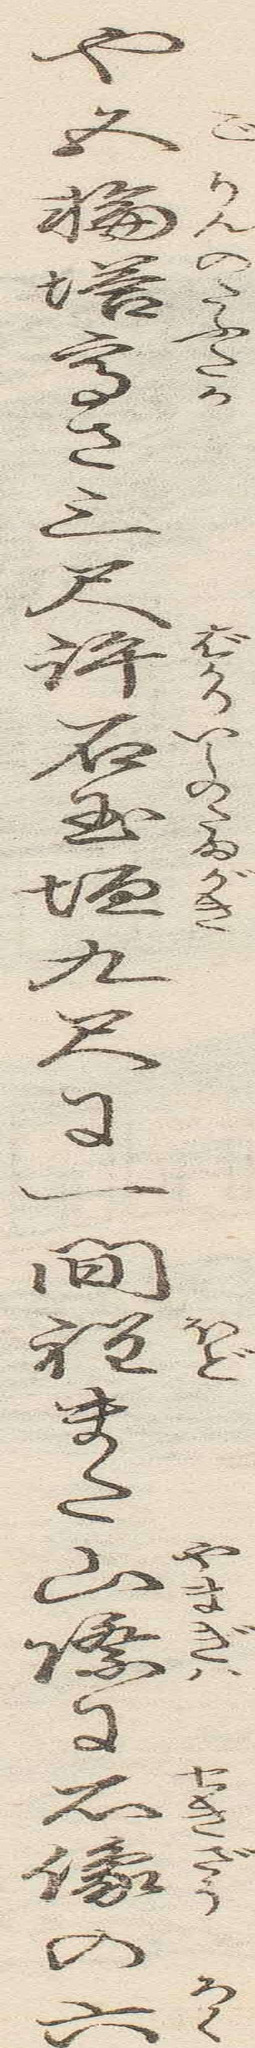や五輪塔高さ三尺許石玉垣九尺に一間程また山際に石像の六
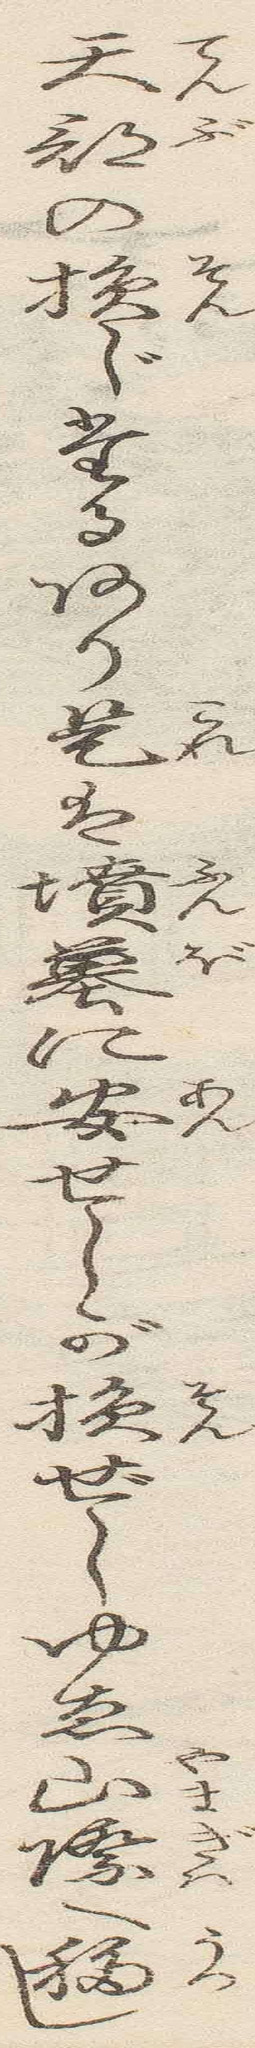天部の損じたるあり是は墳墓に安せしが損ぜしゆゑ山際へ移し
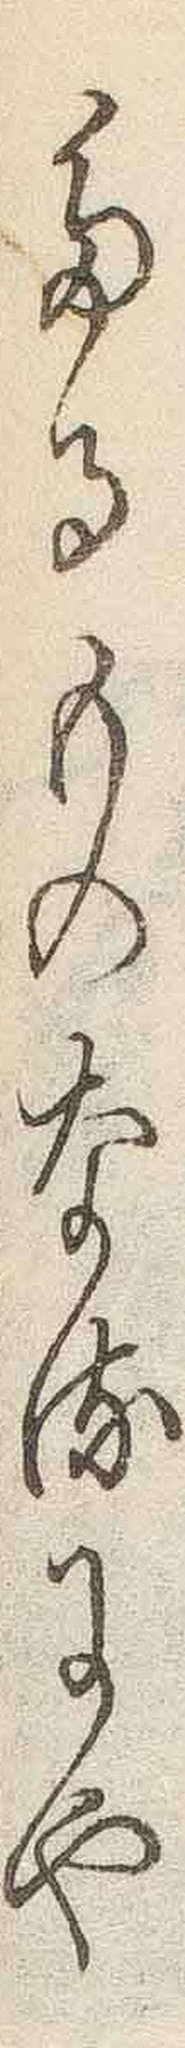たるものなるにや
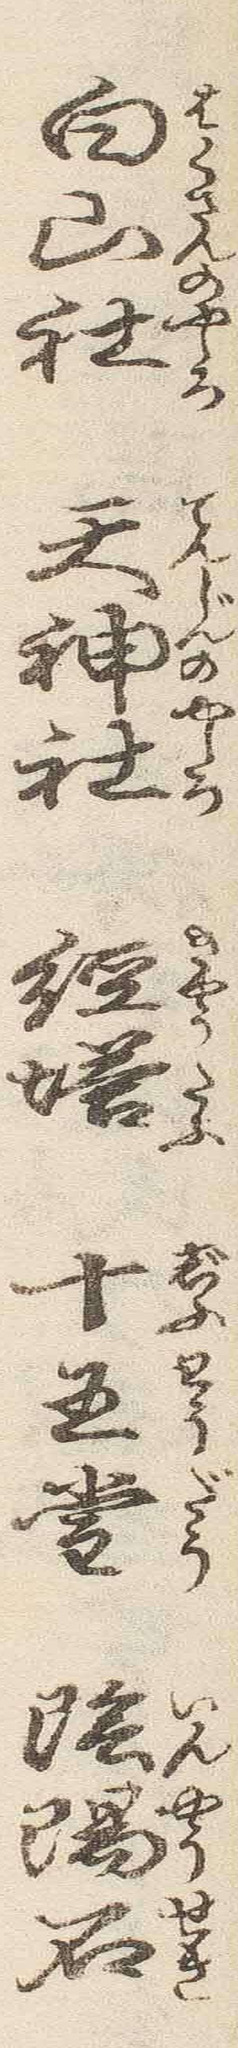白山社天神社經塔十王堂陰陽石
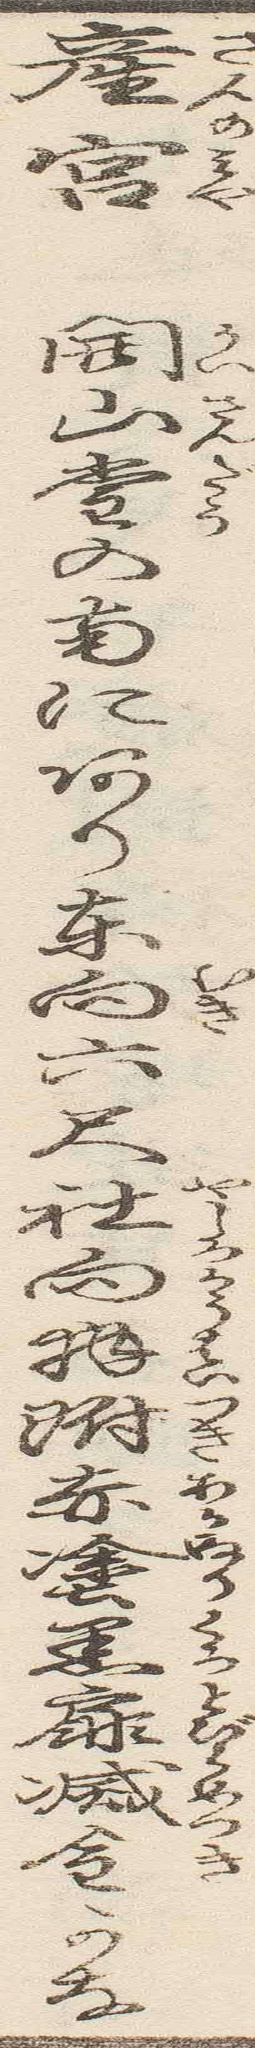産宮開山堂の南にあり東向六尺社向拜附赤塗黒扉滅金かな
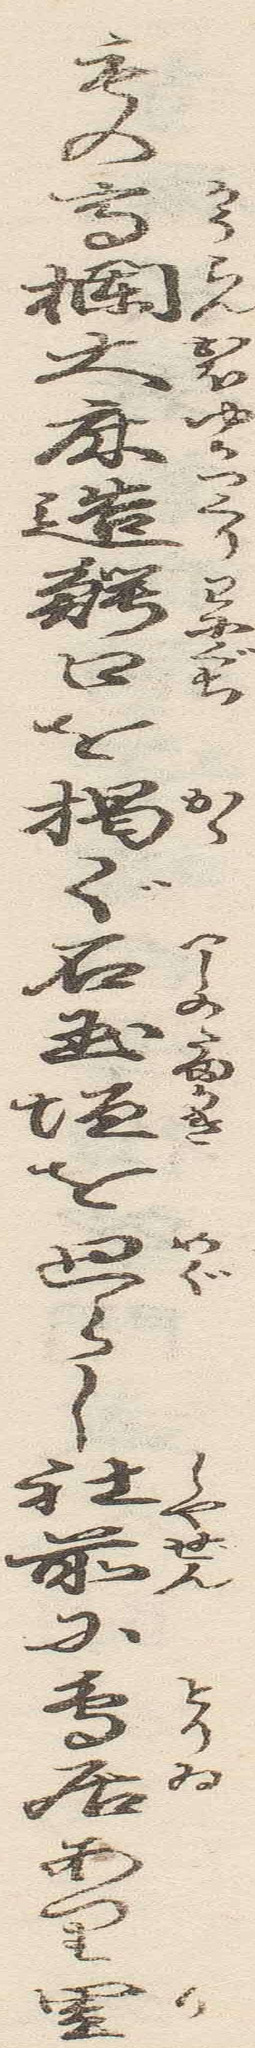もの高欄大床造鰐口を掲ぐ石玉垣を廻らし社前に鳥居あり里
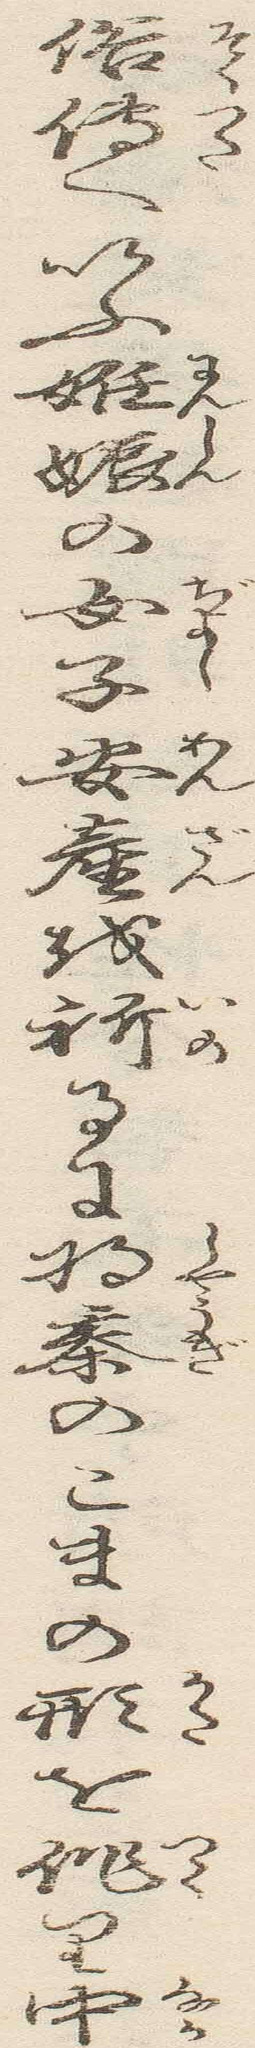俗傳へいふ姙娠の女子安産を祈るに将棊のこまの形を作り中
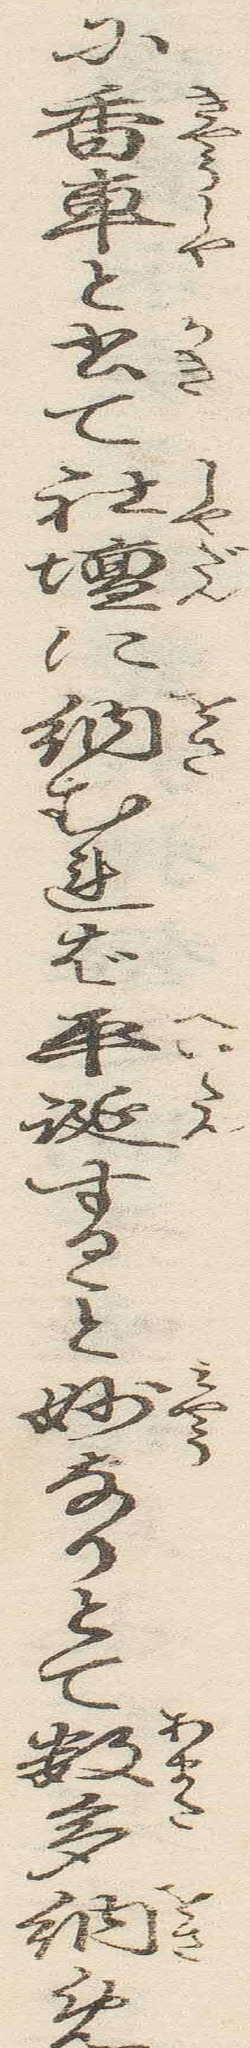に香車と書て社壇に納むれば平誕すること妙なりとて数多納め
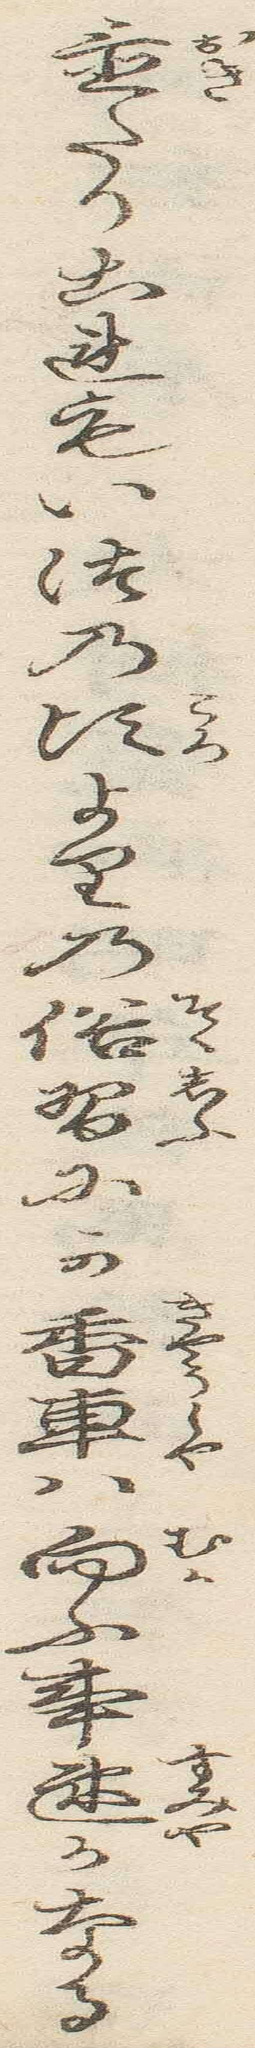置たりこれもいつの頃よりの俗習にか香車は向ふ事速かなる
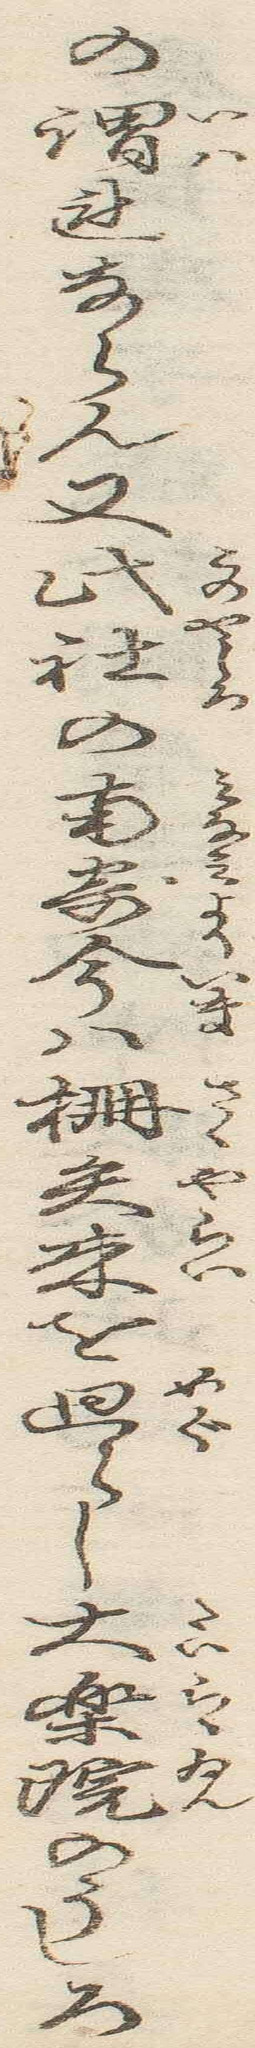の謂れならん又此社の南寄今は柵矢來を廻らし大楽院のうしろ
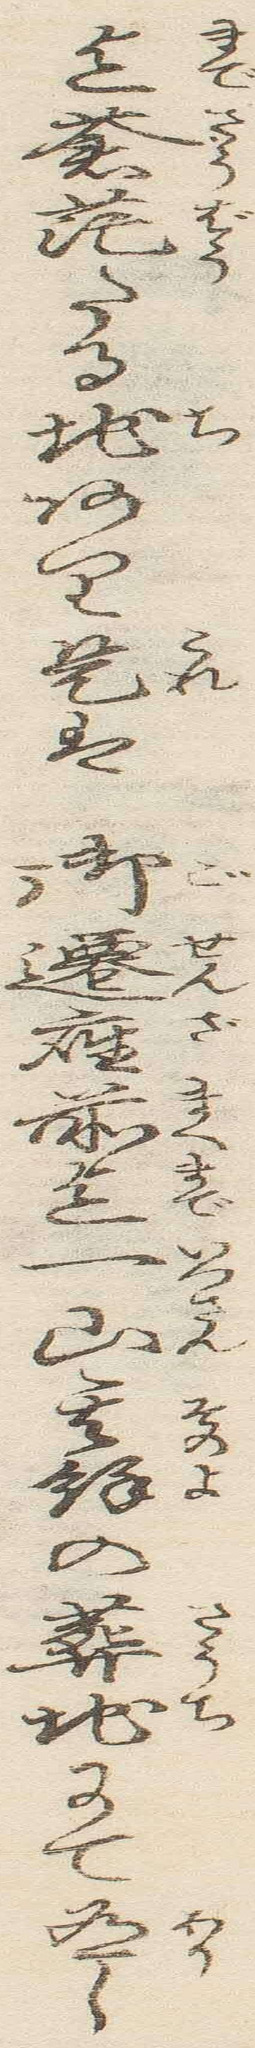迄蒼茫たる地あり是は御遷座前迄一山其餘の葬地にて有し
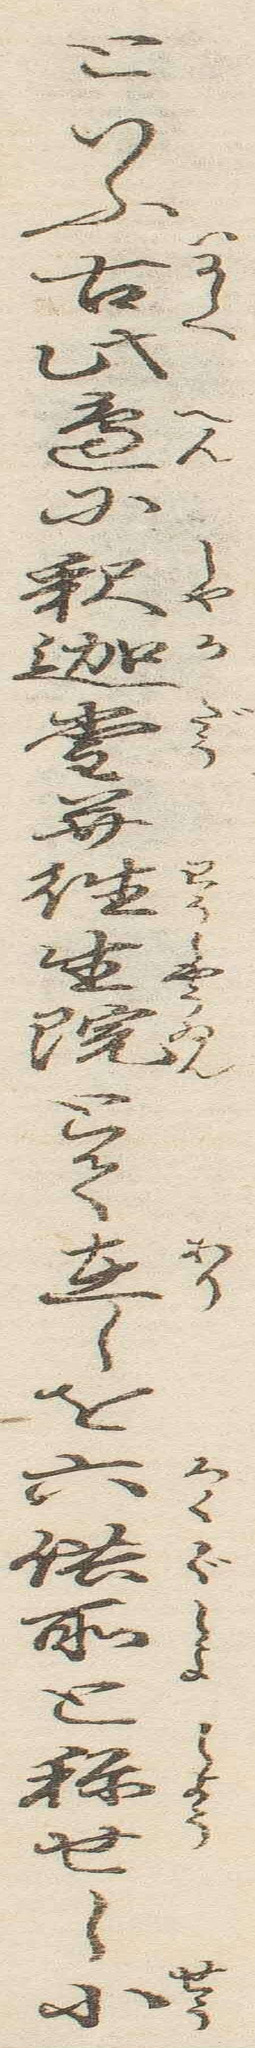といふ古此邊に釈迦堂并徃生院とて在しを六供所と称せし小
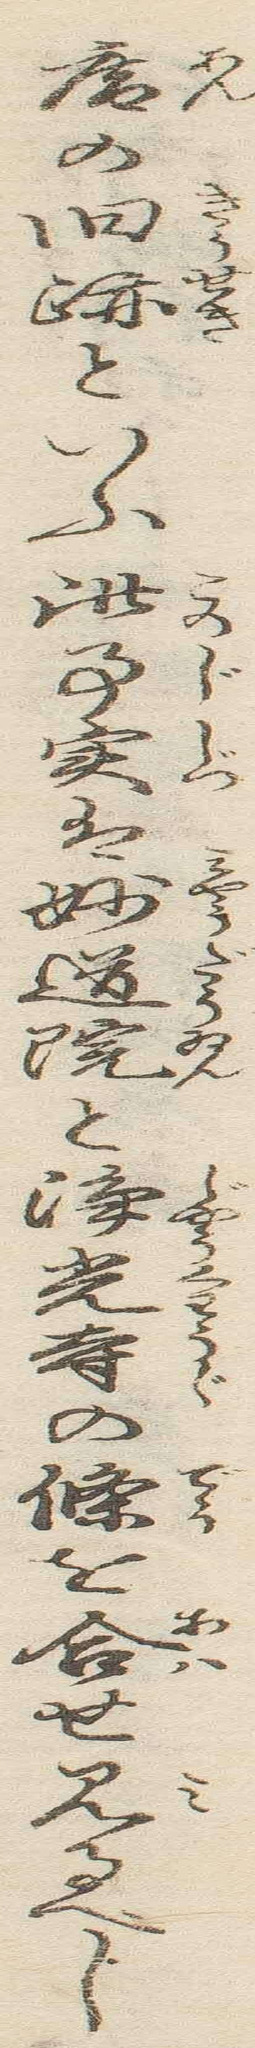庵の旧跡といふ此事実は妙道院と浄光寺の條を合せ見るべし
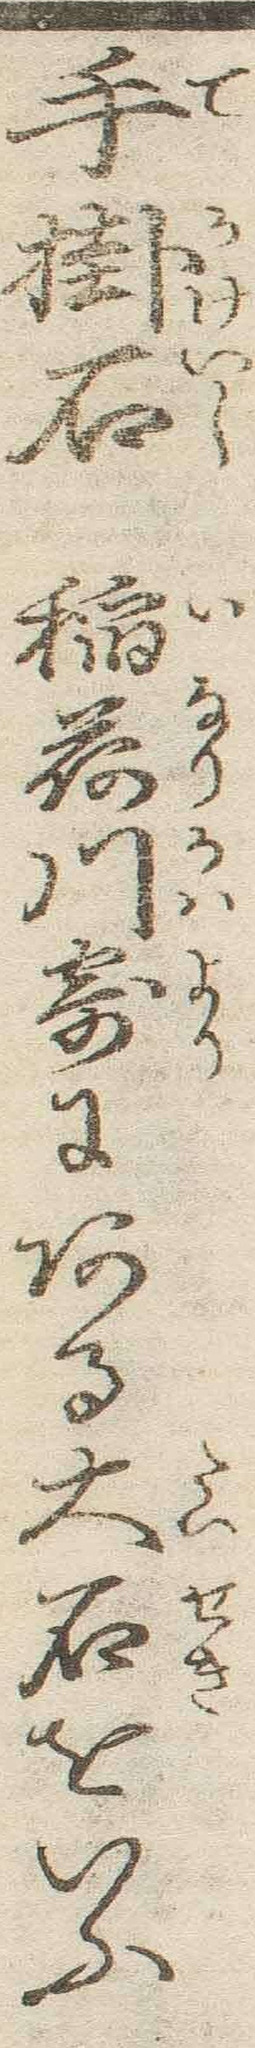手掛石稲荷川寄にある大石をいふ
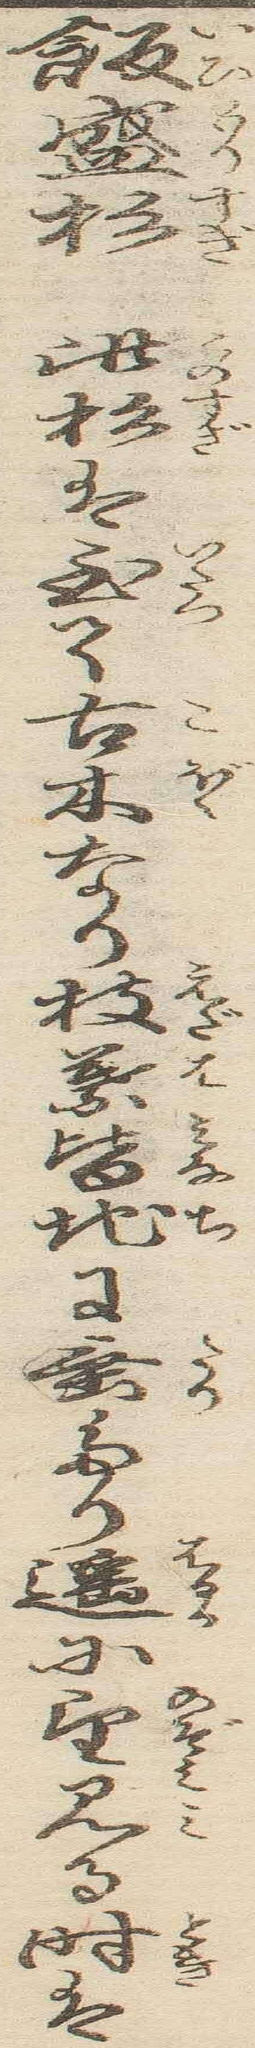飯盛杉此杉は至て古木なり枝葉皆地に垂たり遥に望見る时は
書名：日光山志
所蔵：東京学芸大学附属図書館 国文学研究資料館
